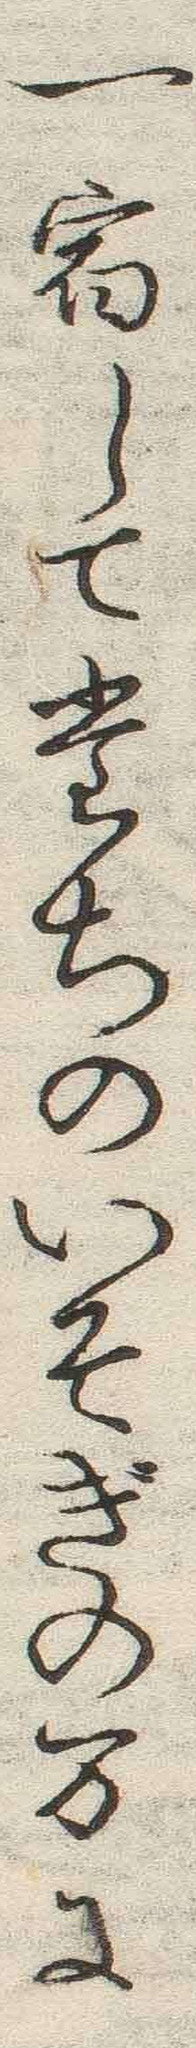一宿してたちのいそぎのまに
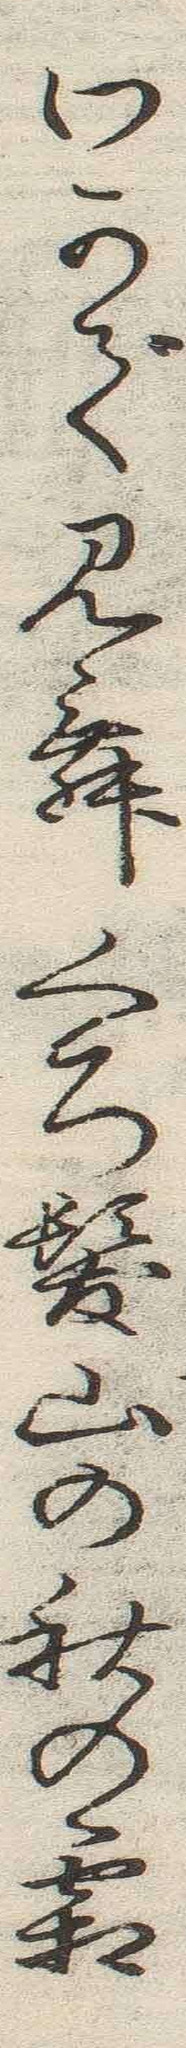わかで見舞くろ髪山の秋の霜
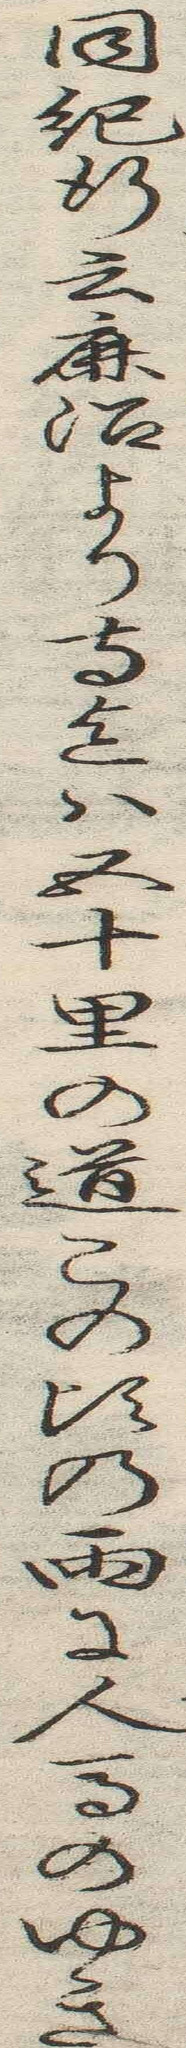同紀行云鹿沼より寺迠は五十里の道この頃の雨に人馬のゆき
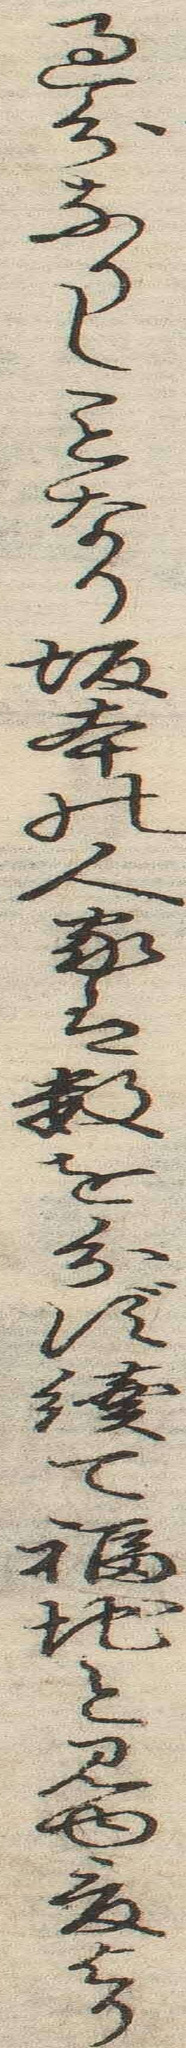過分なりしことなり坂本の人家は数を分ず續て福地と見ゆ爰より

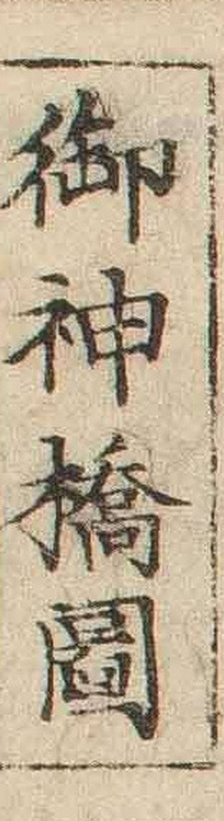御神橋圖

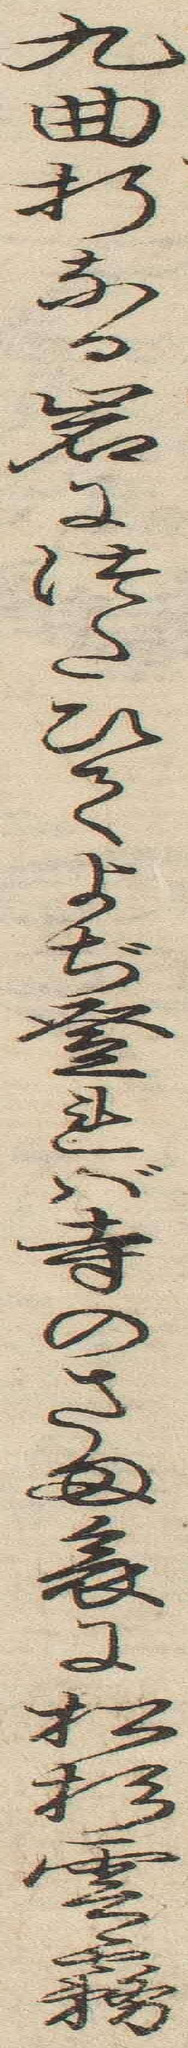九曲折なる岩につたひてよぢ登れば寺のさま哀に松杉雲霧
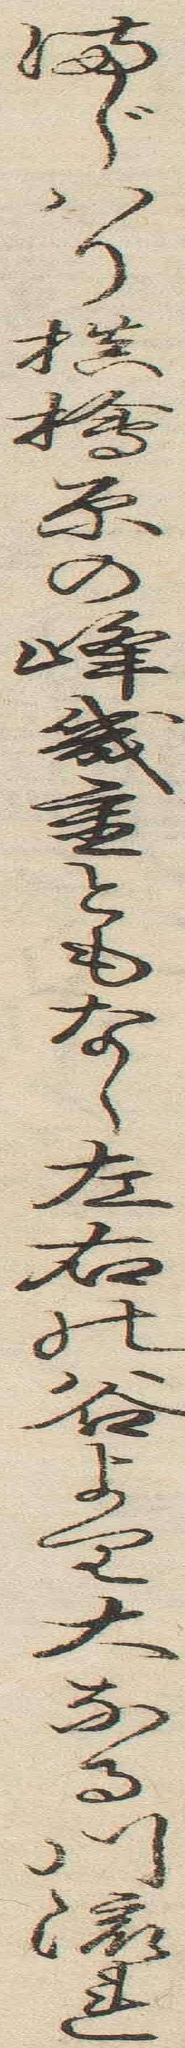まじはり槇檜原の峰幾重ともなし左右の谷より大なる川流れ
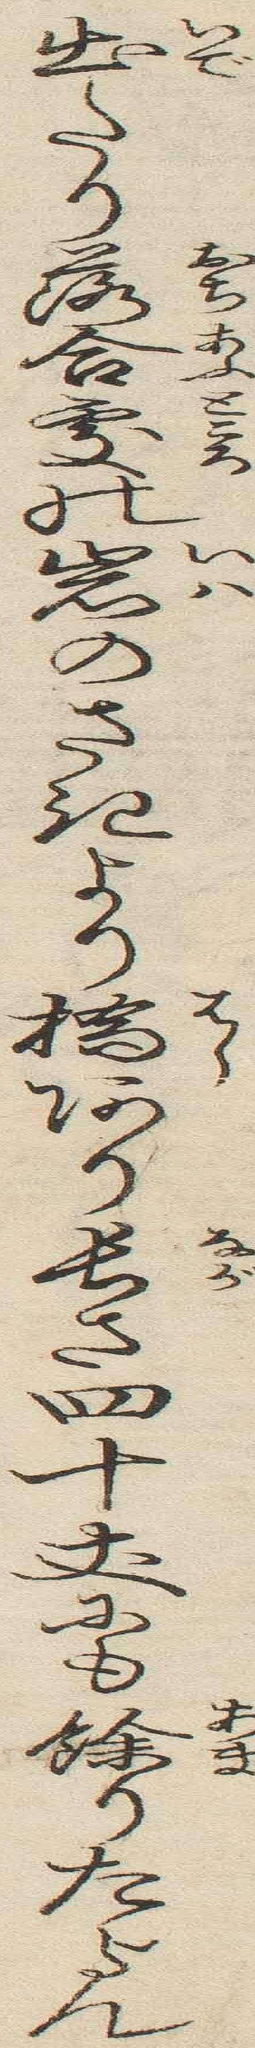出たり落合處の岩のさきより橋あり長さ四十丈にも餘りたらん
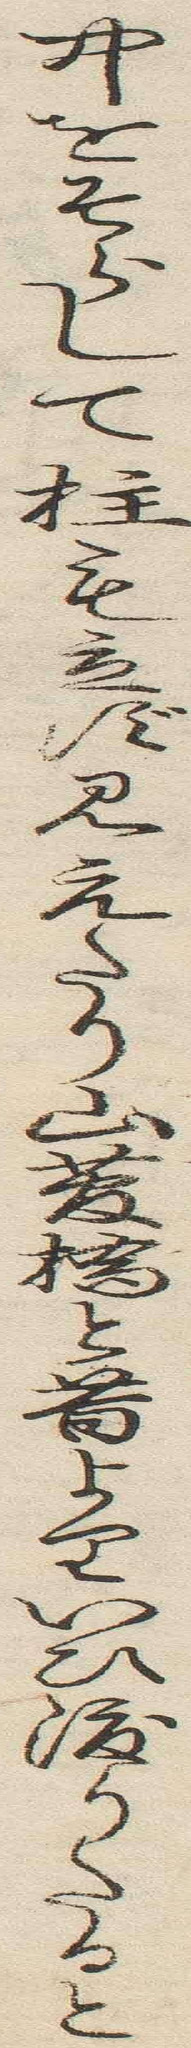中をそらして柱も立ず見えたり山菅橋と昔よりいひ渡りたると
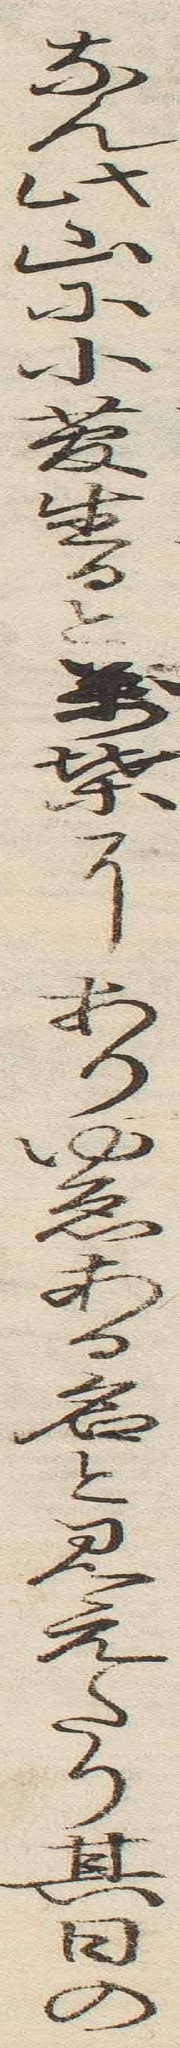なん此山に小菅生ると萬葉にありゆゑある名と見えたり其日の
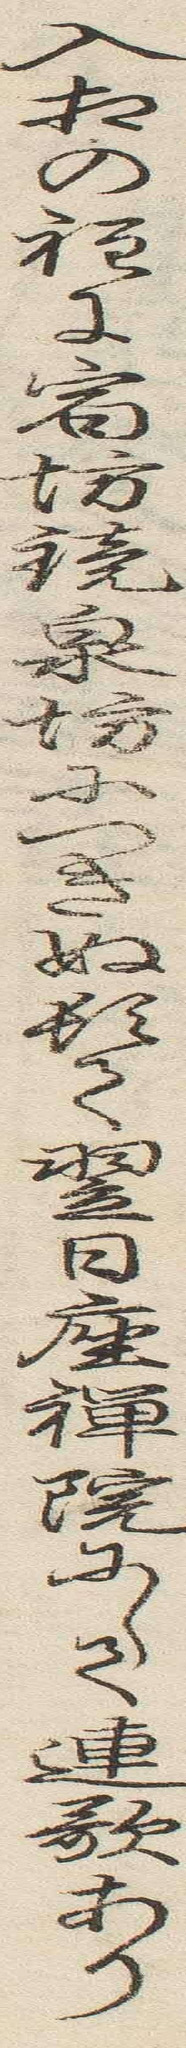入相の程に宿坊鏡泉坊につきぬ頓て翌日座禅院にて連歌あり
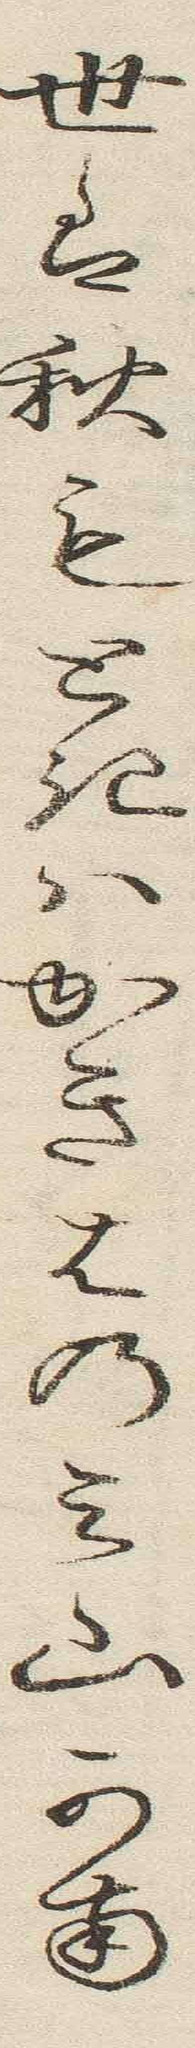世は秋もときはかきはのみ山かな
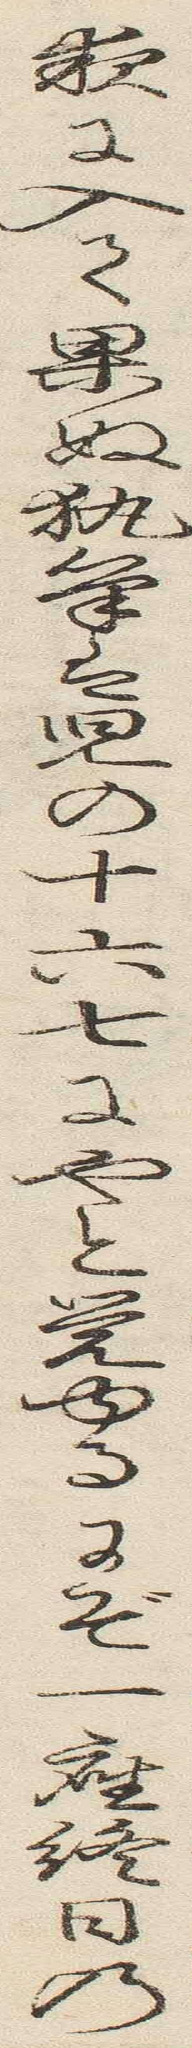夜に入て果ぬ執筆は児の十六七にやと覚ゆるにぞ一座終日の
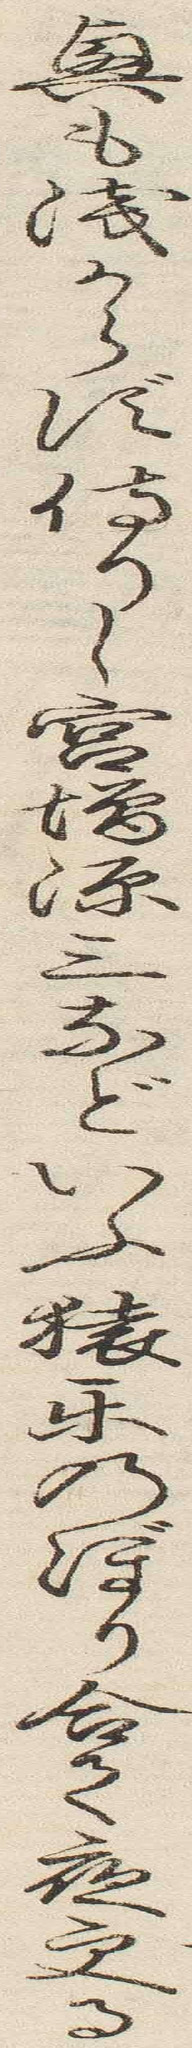興も浅からず侍りし宮増源三などいふ猿楽のぼり合て夜更る
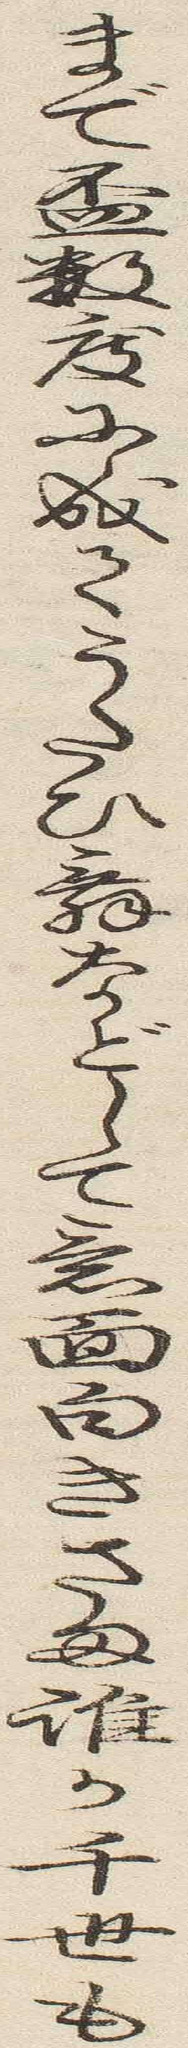まで盃数度に成てうたひ舞などして意面白きさま誰か千世も
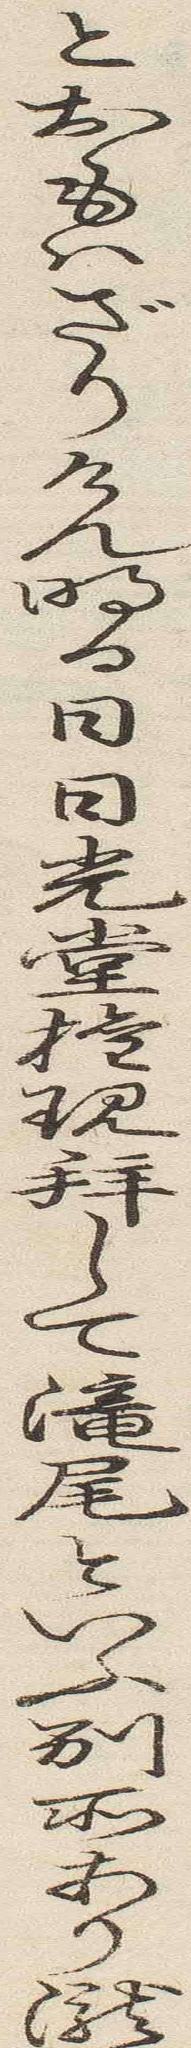とおもはざりけん明る日日光堂權現拜して滝尾といふ別所あり瀧
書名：日光山志
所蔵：東京学芸大学附属図書館 国文学研究資料館
